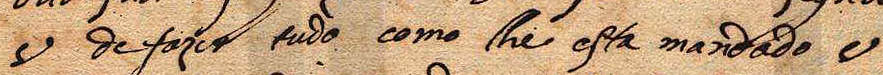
E de fazer tudo como lhe esta mandado E
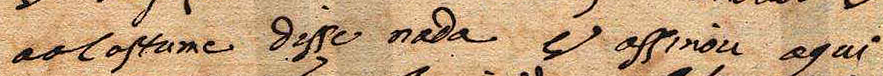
ao costume disse nada E assinou aqui
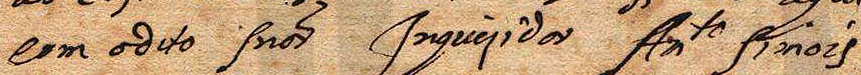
com o dito snōr Jnquisidor Anto Simois
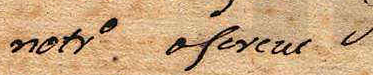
notro o screui
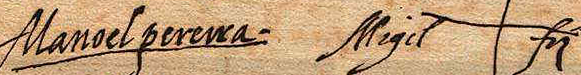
Manoel pereira Migel + frz̄
